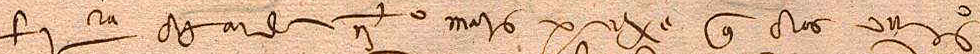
frra A tarde mto majs peixe q̄ Aos outos
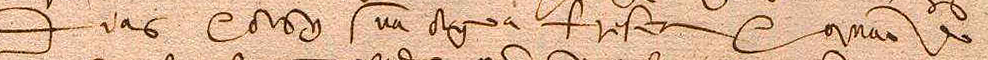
dias e Asy sua Agoa fresca e quãodo
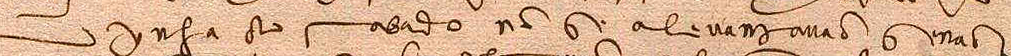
vynha Ao sabado nō se aleuantauaõ senaõ
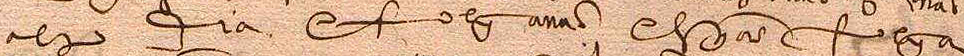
alto dia e folgauaõ e hyão folgar
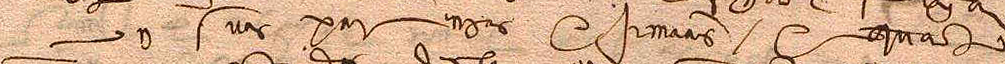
com suas parentas e Jrmaās / e quāto
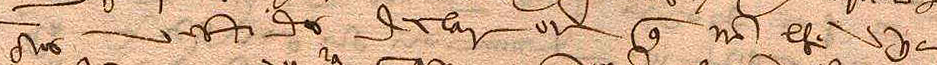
Aos vestidos declarou q̄ nō lhe vya
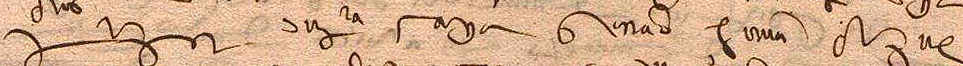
tizer outra saya senaõ huūa Azul
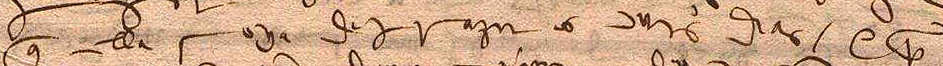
q̄ ella soya de trazer os outos dias / e p̄o
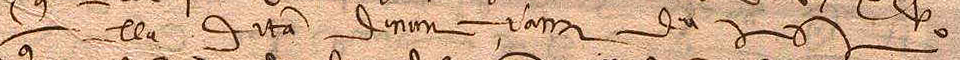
q̄ ella dita denunçiante deu testo
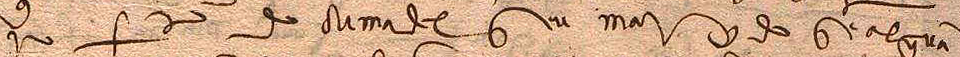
no fto do Armadel seu marydo se alguā
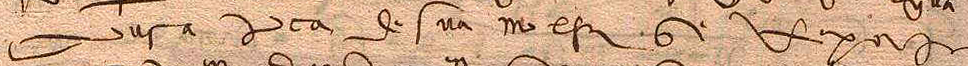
Cousa toca de sua molher. se Reporte
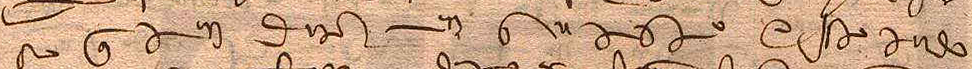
Ao q̄ tem dito em seu testo e Jsto tudo
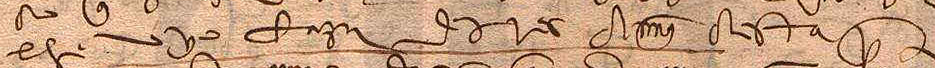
lhe vyo fazer de tres Annꝯ A esta p̄te
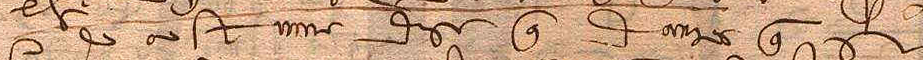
e do costume dise q̄ dantes q̄ se
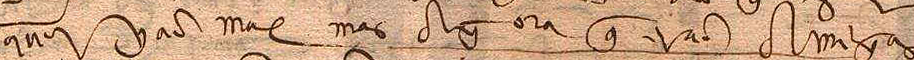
queryaõ mal mas Agora q̄ eraõ Amigas
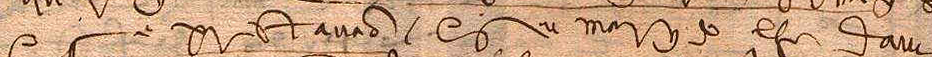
e se prestauaõ / e seu marydo lhe daua
